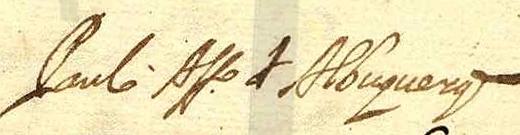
Paulo Aff.o d̄ Albuquerq̄
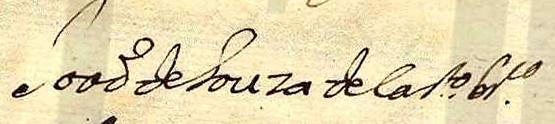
Ioaõ de Souza de Cast.o br.co
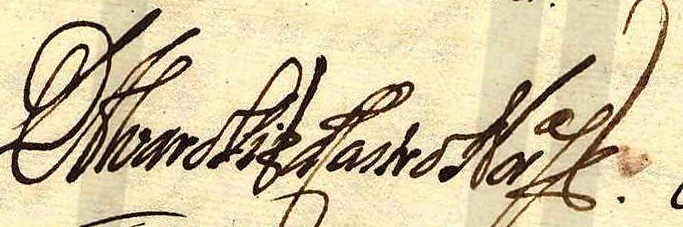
D Aluaro Piz̄ d̄ Castro Nor.a
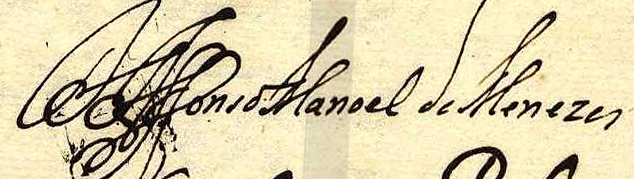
D Affonso Manoel de Menezes
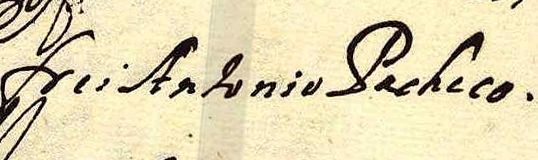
frei Antonio Pacheco.
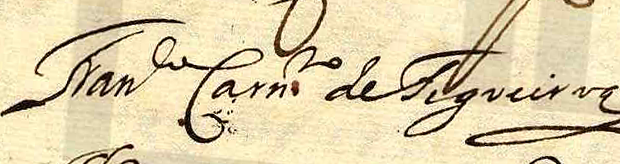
Franco Carn.ro de Figueiroa
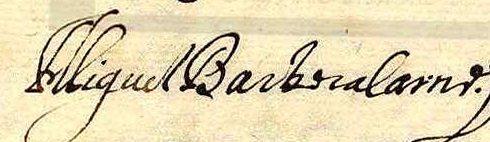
Miguel Barboza Carnr.o
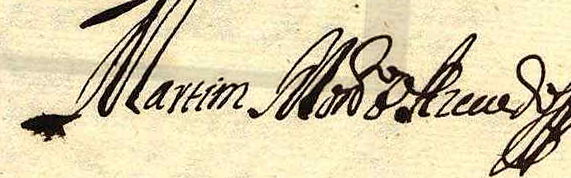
Martim Mon.to d̄ Azeuedo
